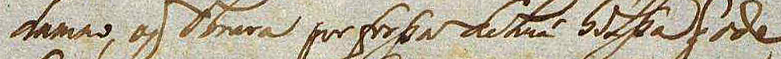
damno, o q̄ obrara por forssa de huā bolssa q̄ o de
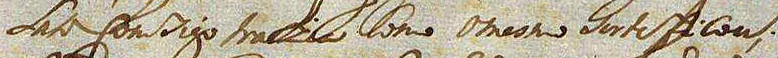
lato Consigo trazia Como o mesmo serteficou;
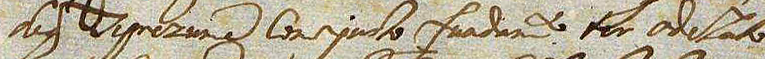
de q̄ se prezume como justo fundam.to ter o delato
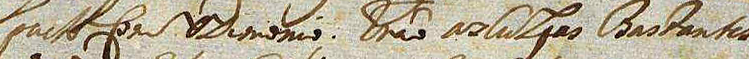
pacto Com o Demonio; E naõ as Culpas Bastantes
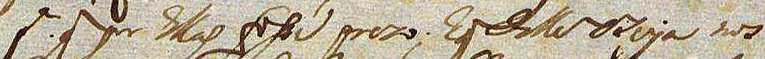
pa. q̄ por Ellas fosse prezo. E q̄ Elle o seja nos
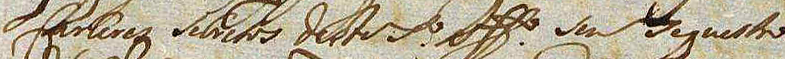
Carceres secretos deste s.to off.o sem sequestro
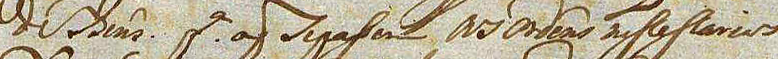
de Bens̄. p.a o q̄ se passem as ordens nessessarias
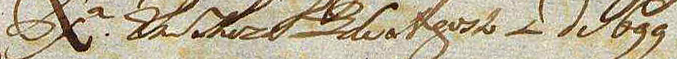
LX.a Em Meza E de Agosto 1 de 699
